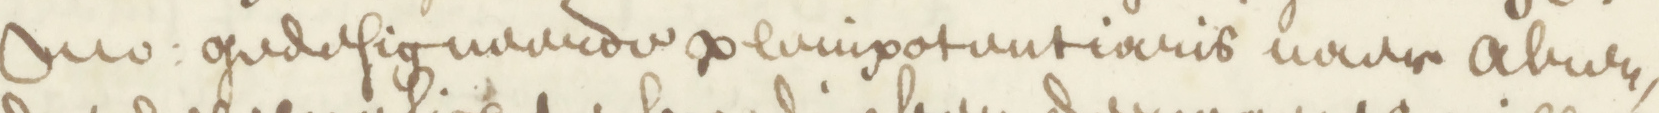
Mo: gedesigneerde plenipotentiaris naer Aken,
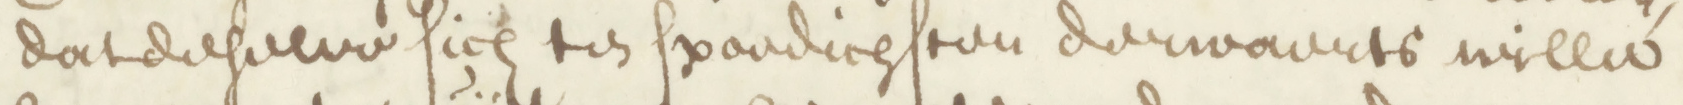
dat deselve sich ten spoedichsten derwaerts wille
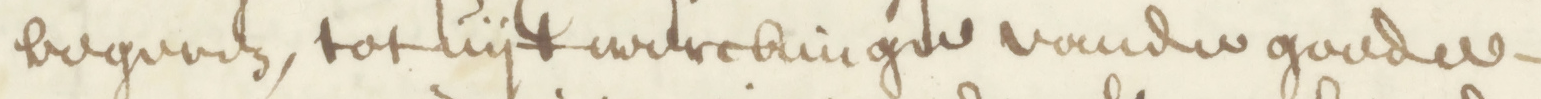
begeven, tot uijtwerckinge vande goede
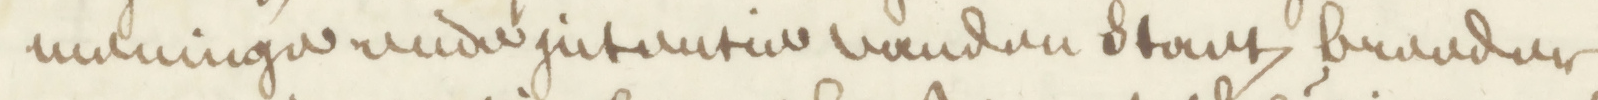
meninge ende intentie vanden Staet, breeder
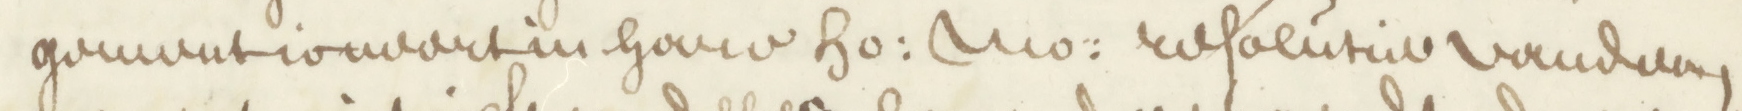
gementioneert in hare Ho:Mo: resolutie vanden
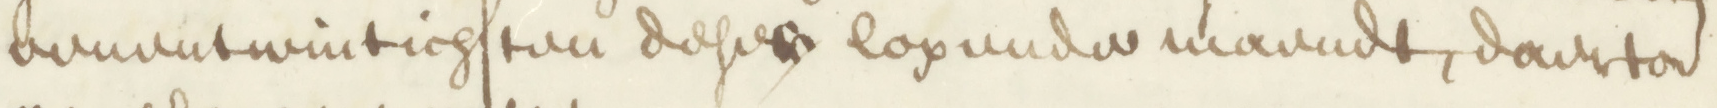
eenentwintichsten deser lopende maendt, daertoe
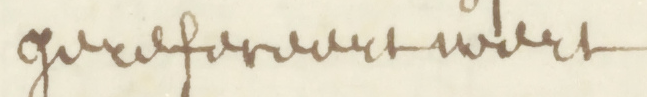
gerefereert wert
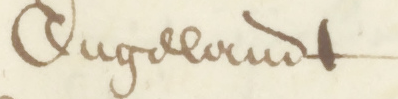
Engelandt
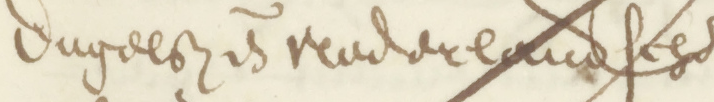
Engels en Nederlandsch
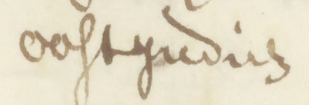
oostIndien
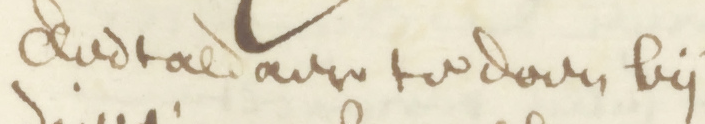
Eedt aldaer te doen bij
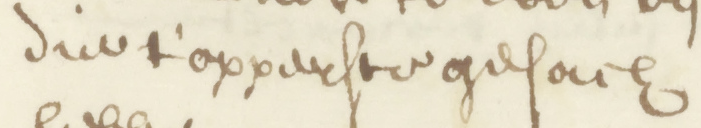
die t'opperste gesach
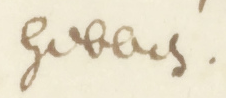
hebben.
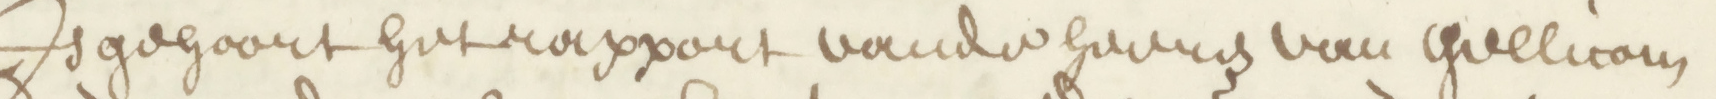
Is gehoort het rapport vande heeren van Gellicom
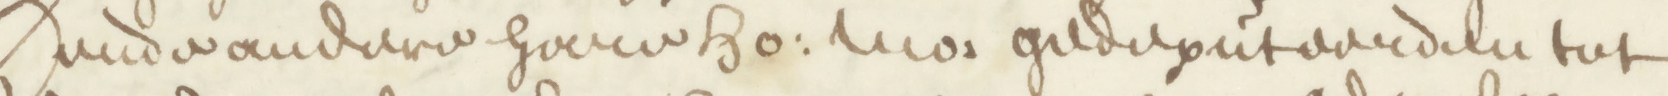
ende andere hare Ho:Mo: gedeputeerden tot
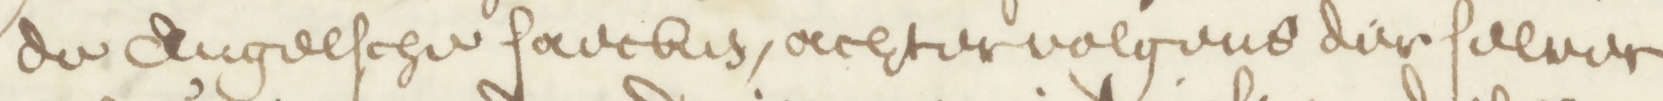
de Engelsche saecken, achtervolgens der selver
